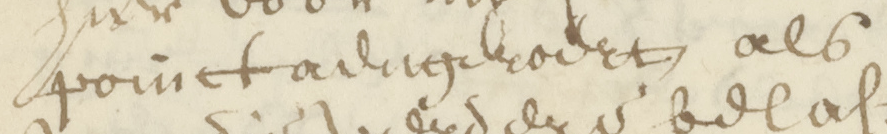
poinct aengeroert, als
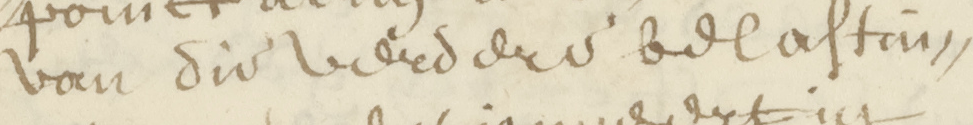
van die verdere belastin„
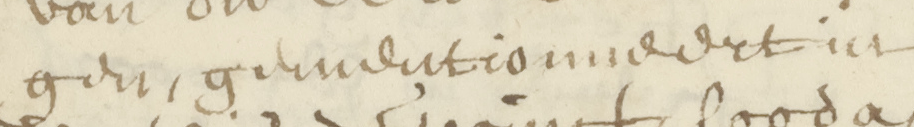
gen, gementionneert in
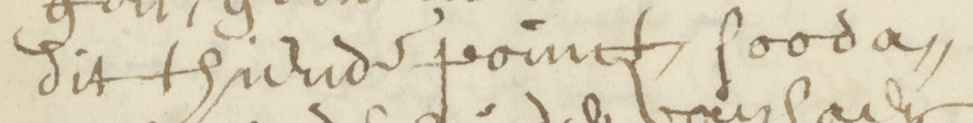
dit thiende poinct, sooda„
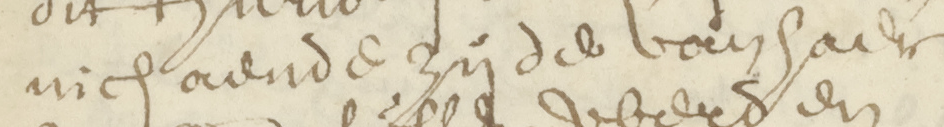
nich aende zijde van haer
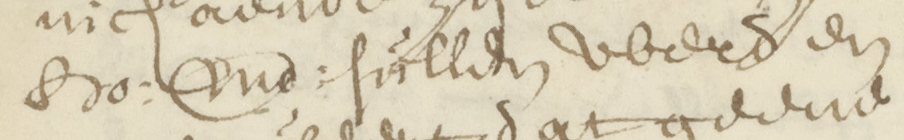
Ho:Mo: sullen werden
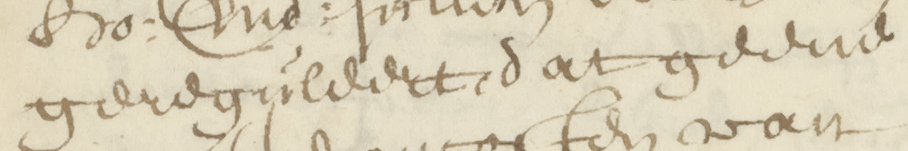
gereguleert, dat geene
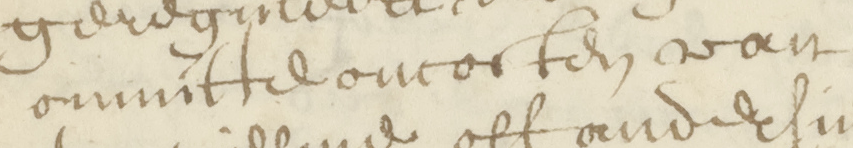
onnutte oncosten van
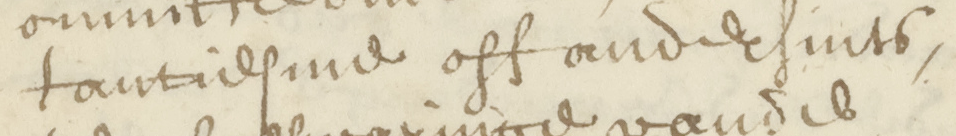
tantiesme off andersints,
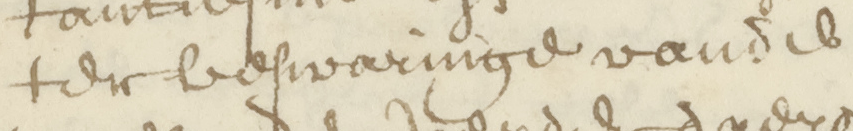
ter beswaringe vande
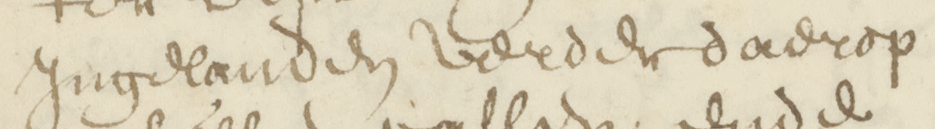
Ingelanden verder daerop
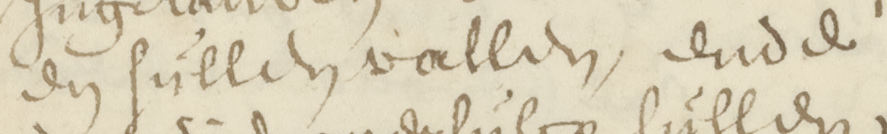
en sullen vallen, ende
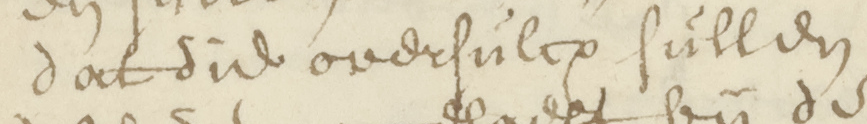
dat die oversulcx sullen
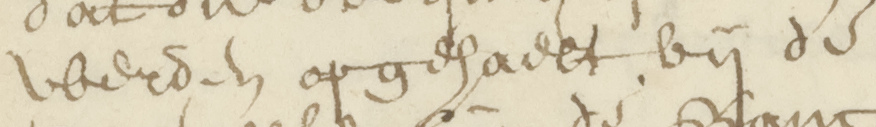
werden opgehaelt bij de
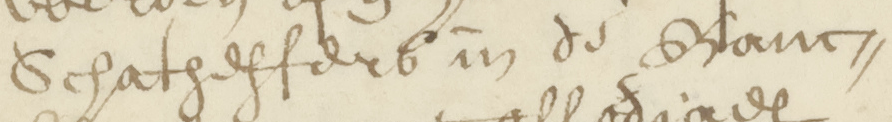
Schatheffers in de Banc„
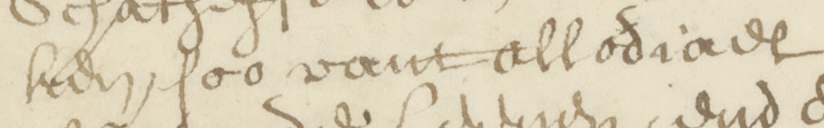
ken, soo vant allodiael
